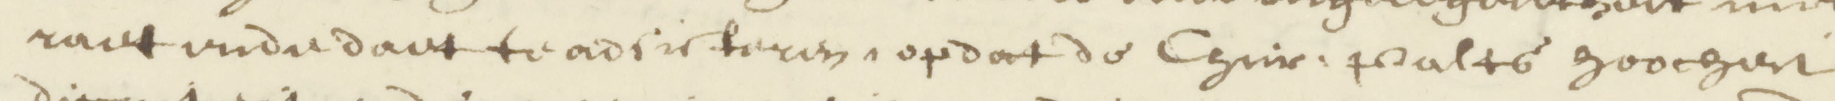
raet ende daet te adsisteren, op dat de Chur: Palts hoochen
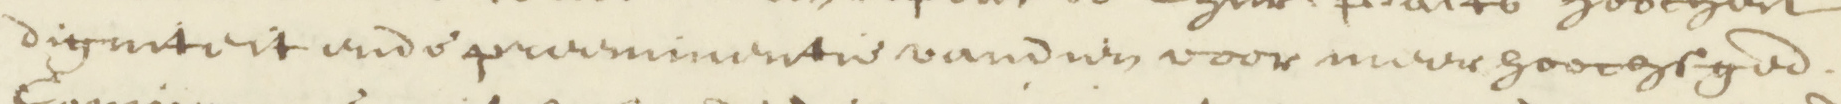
diginiteit ende preeminentie vandien voor meer hoochsged.
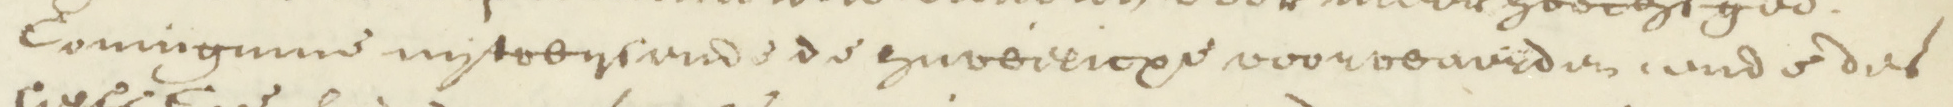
Coninginne uijtwysende de huwelicxe voorwaerden, ende des
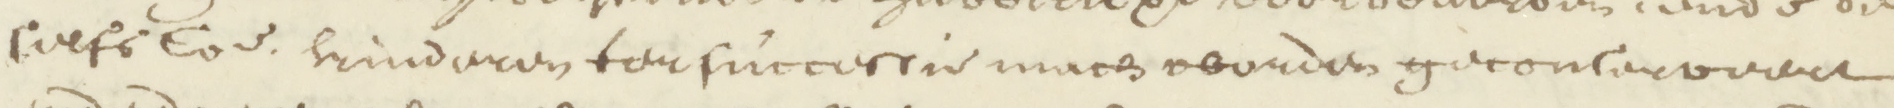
selfs Cos. kinderen ter successie mach worden geconserveert
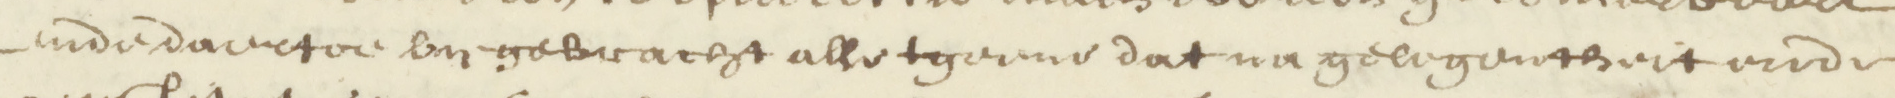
Ende daertoe by gebracht alle tgeene dat na gelegentheit ende
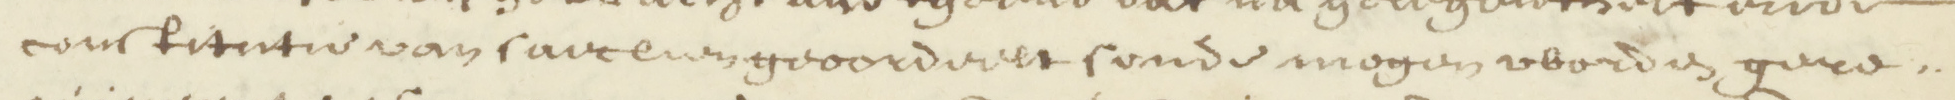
constitutie van saecken geoordeelt soude mogen worden gere„
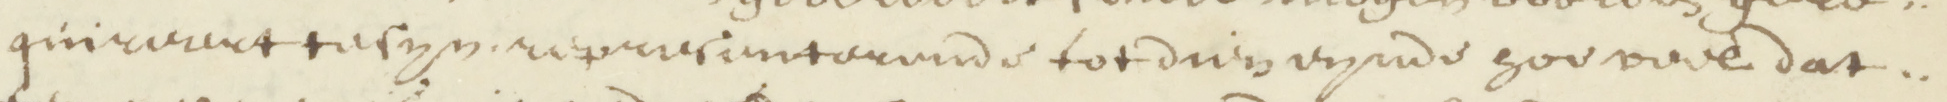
quireert te syn, representerende tot dien eynde hoe veel dat„
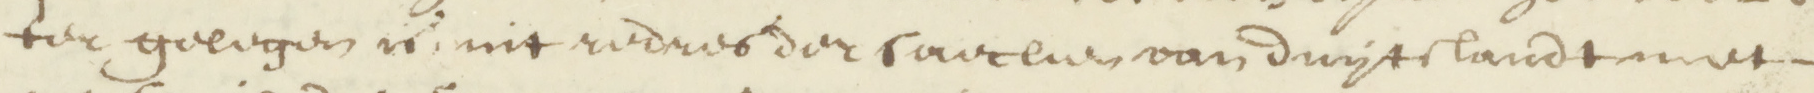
ter gelegen is int redres der saecken van duijtslandt met
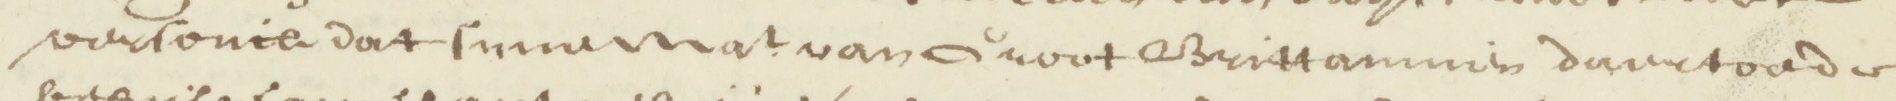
versouck dat syne Mat. van Groot Brittannien daertoe de
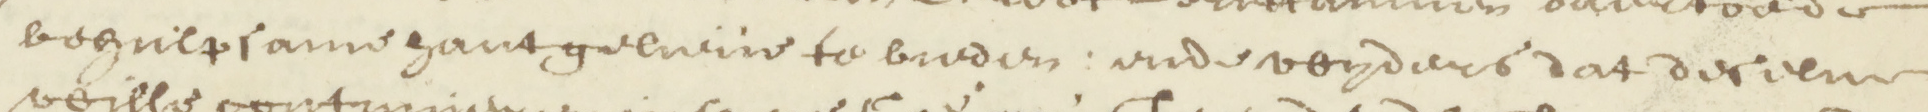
behulpsame hant gelieve te bieden: ende wyders dat deselve
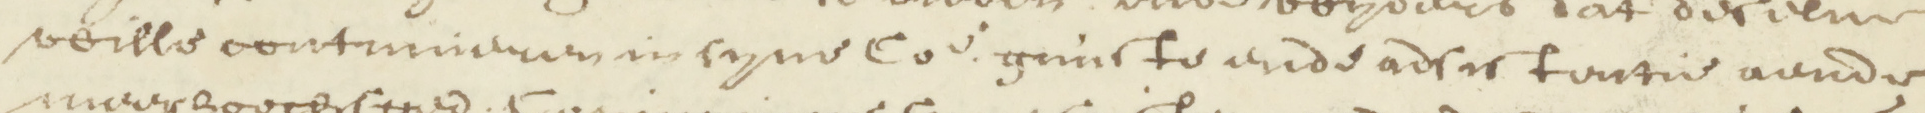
wille continueren in syne Cos. gunste ende adsistentie aende
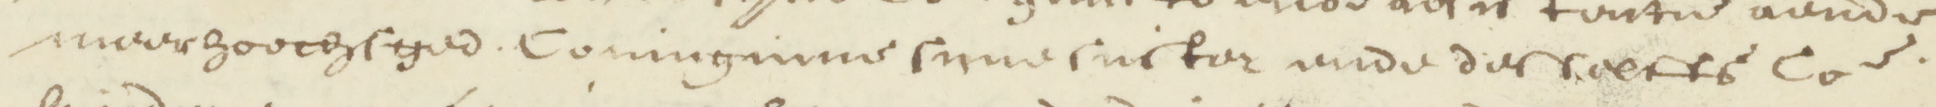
meer hoochsged. Coninginne syne suster ende desselffs Cos.
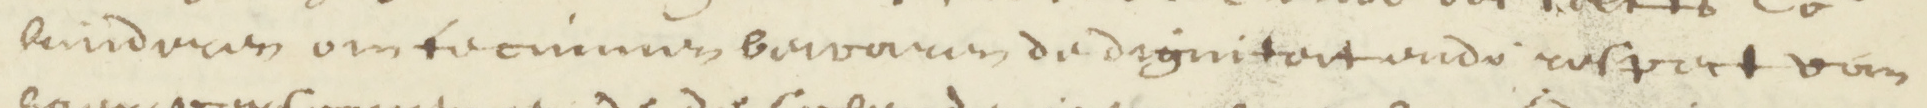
kinderen om te cunnen bewaren de digniteit ende respect van
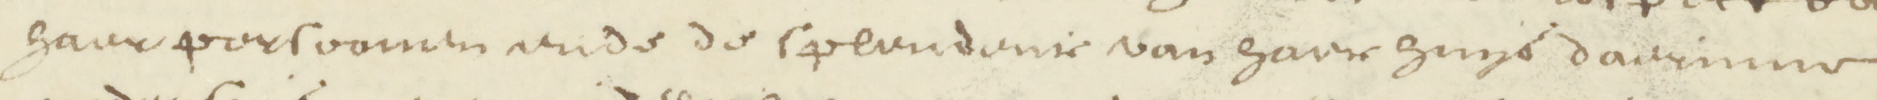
haer persoonen ende de splendeur van haer huys daerinne
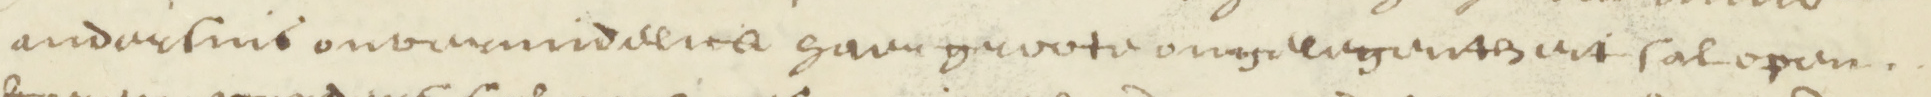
andersins onvermidelick haer groote ongelegentheit sal open„
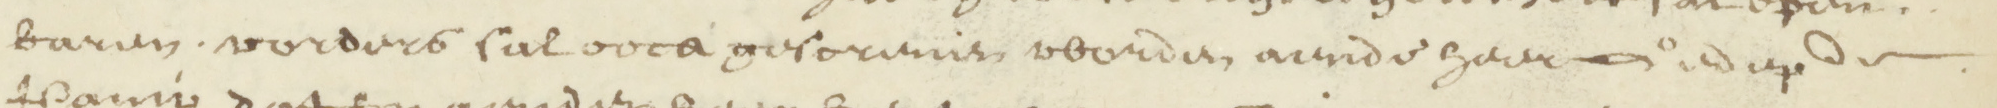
baren, vorders sal oock gescreven worden aende heer Gedepde
